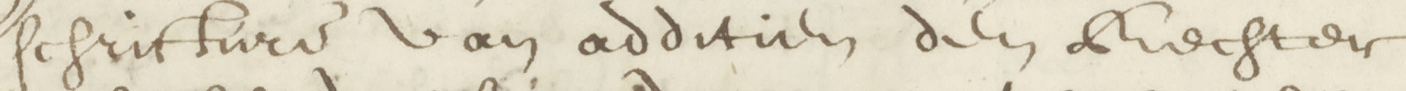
schrifture van additien den Rechter
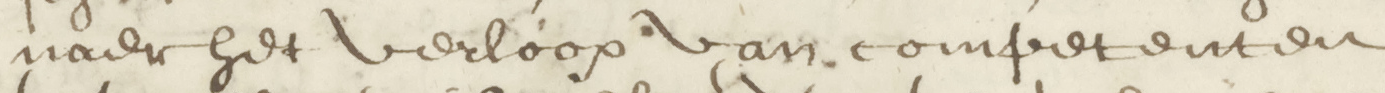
naer het verloop van competenten
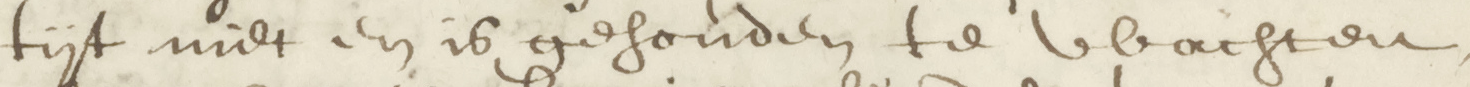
tijt niet en is gehouden te wachten,
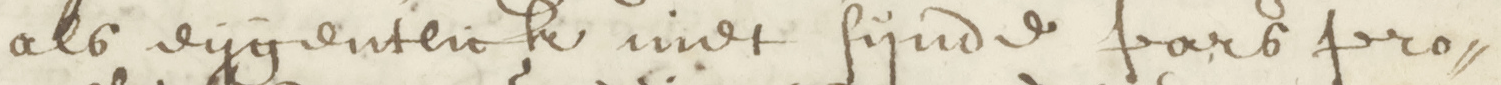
als eijgentlick niet sijnde pars pro„
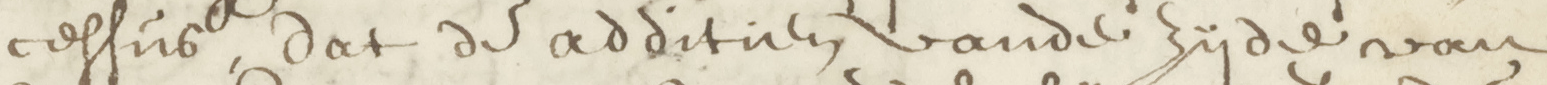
cessus, dat de additien vande zijde van
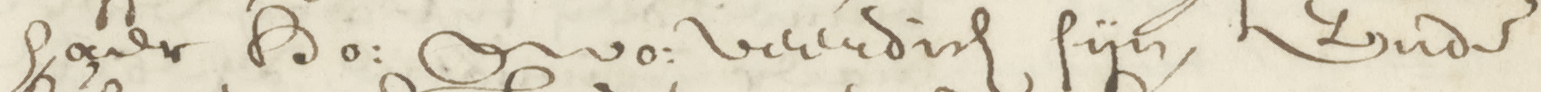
haer Ho:Mo: veerdich sijn, Ende
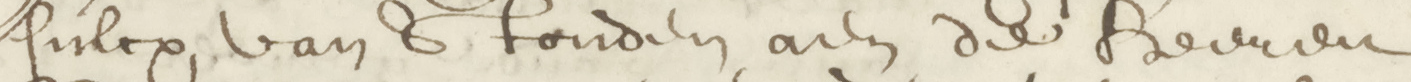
sulcx van Stonden aen de Heeren
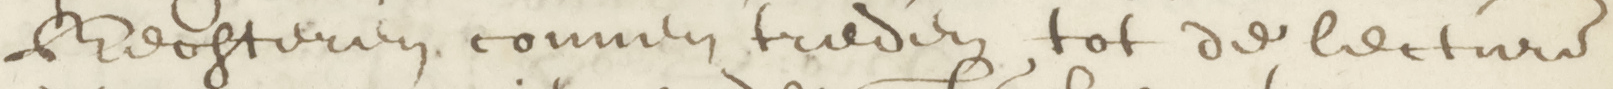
Rechteren connen treden tot de lecture
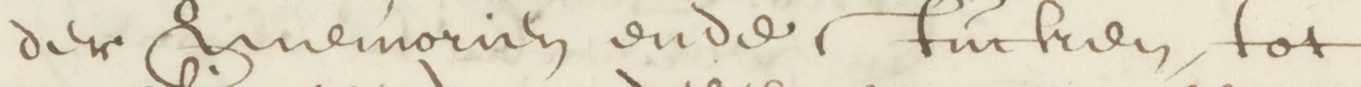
der Memorien ende stucken, tot
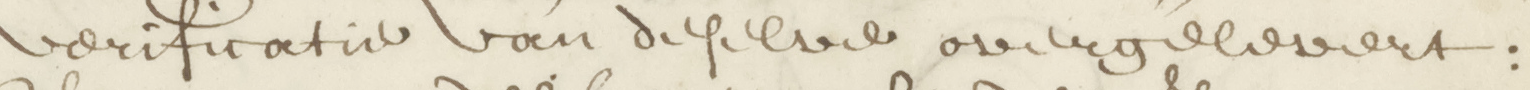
verificatie van deselve overgelevert:
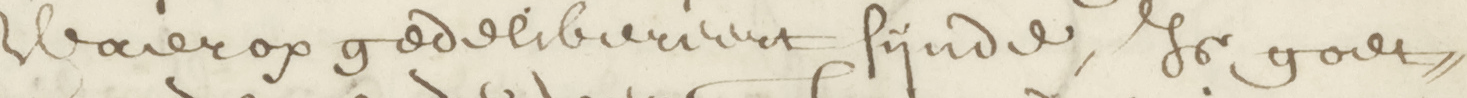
Waerop gedelibereert sijnde, Is goet„
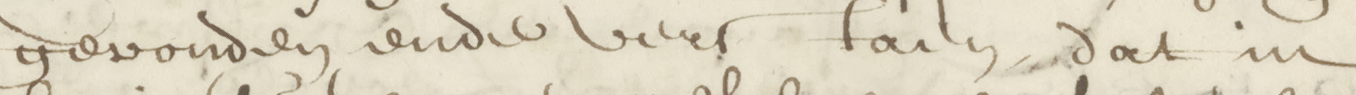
gevonden ende verstaen, dat in
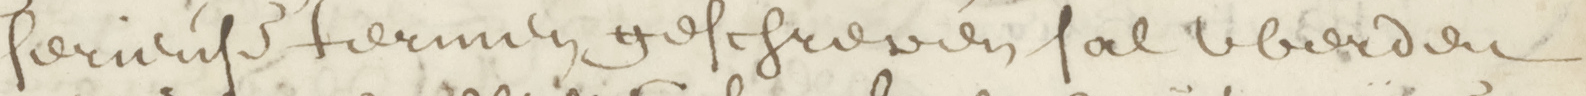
serieuse termen geschreven sal werden
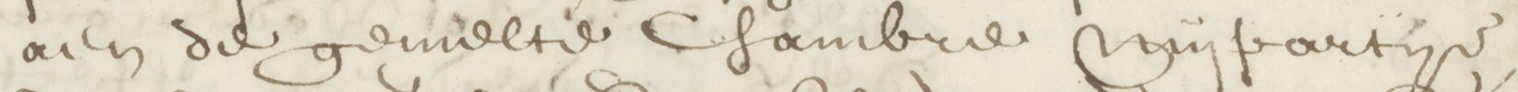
aen de gemelte Chambre Mijpartije
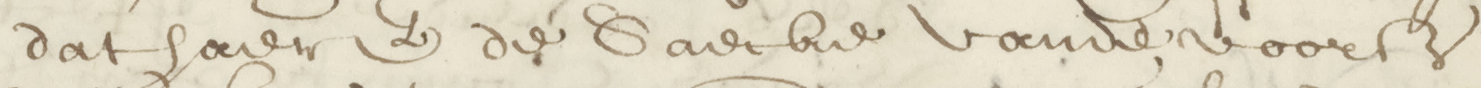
dat haer E. de Saecke vande voorss.
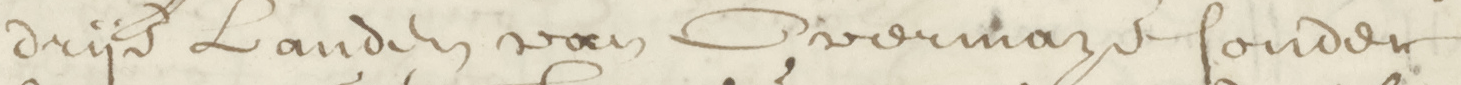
drije Landen van Overmaze sonder
